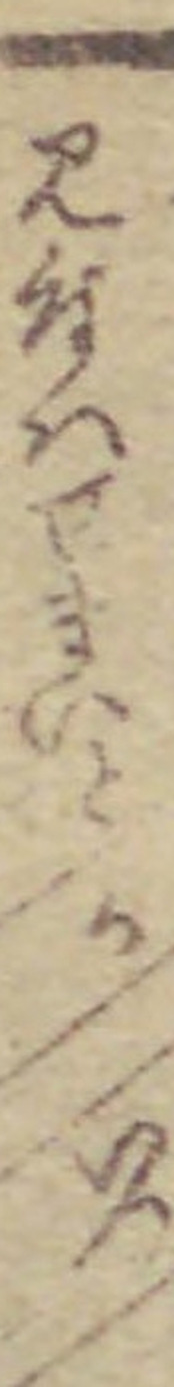見付はせまいとかいつ
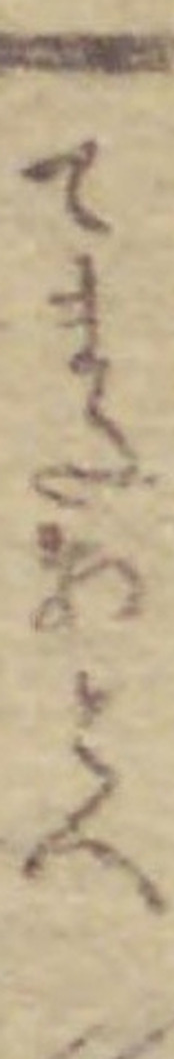てまたあとへ

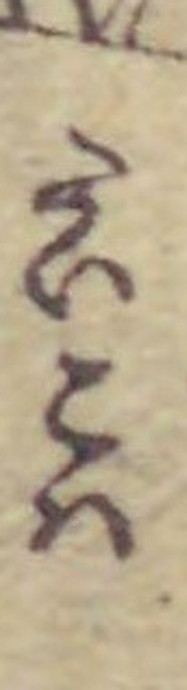たいこは
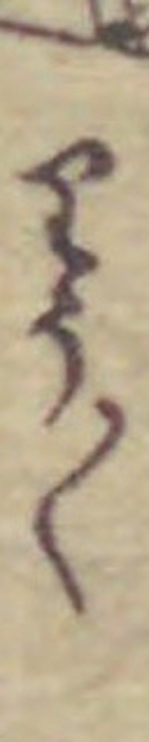りう〳〵
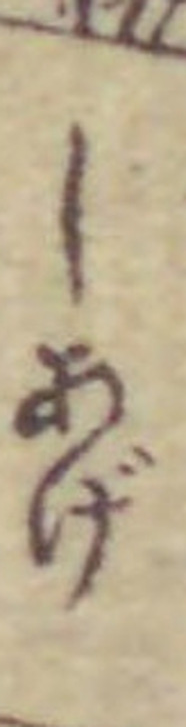しあげ
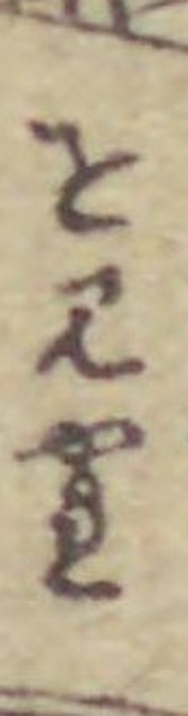を見やれ
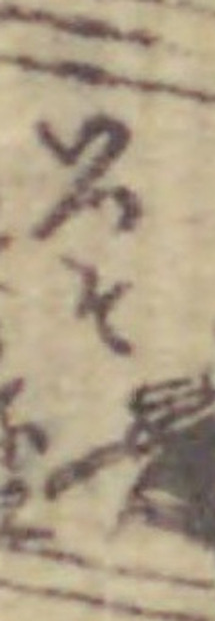いつそ
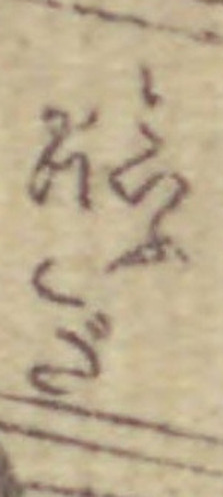といふ
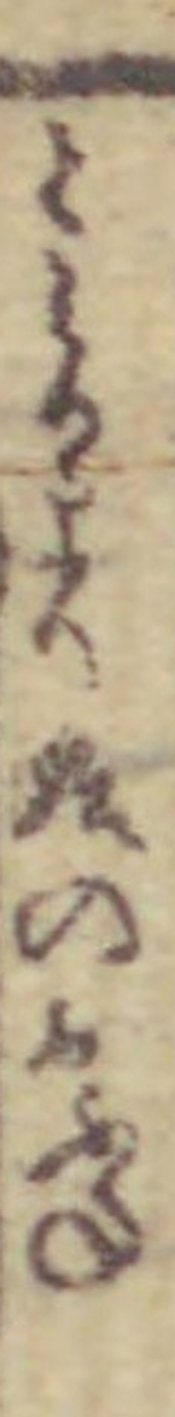とみるより娘のおふね
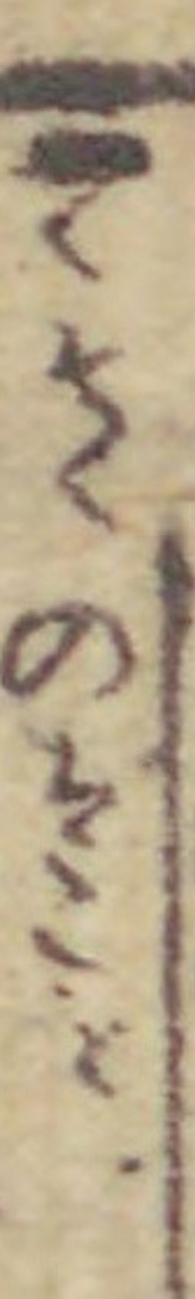くそくのはこを
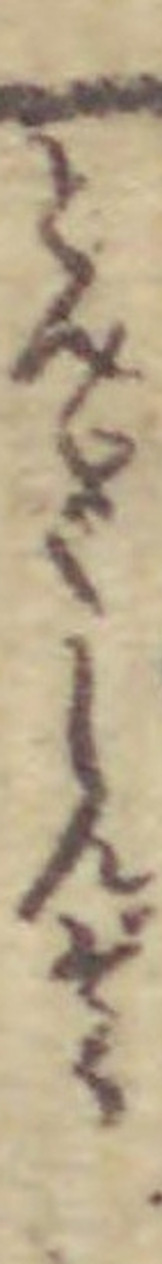とん〳〵〳〵しんぞう
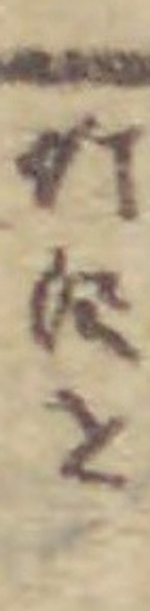竹沢を
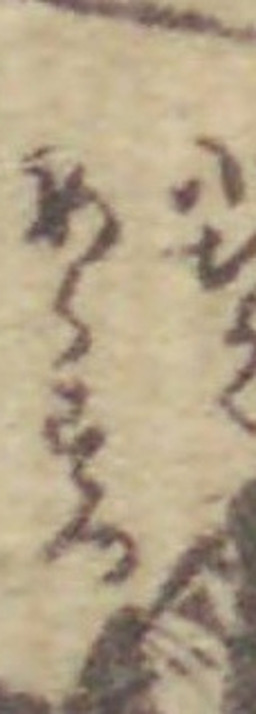めらすつ
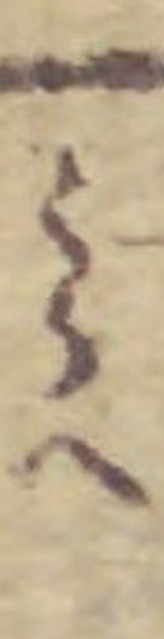とらへ
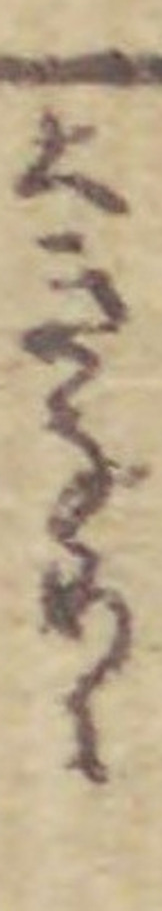大きなめに
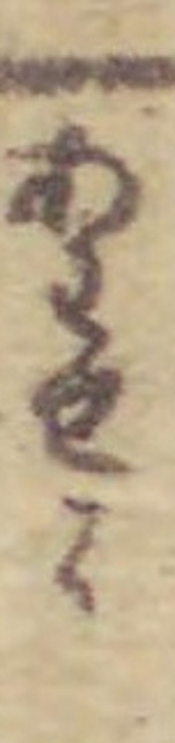あわせは
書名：新例矢口渡 3巻
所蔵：国立国会図書館 National Diet Library, JAPAN
